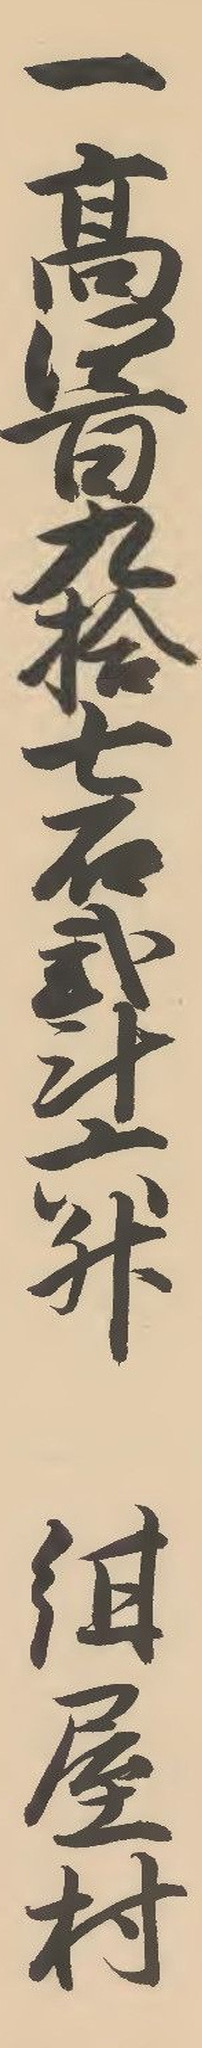一高四百九拾七石弐斗六升紺屋村
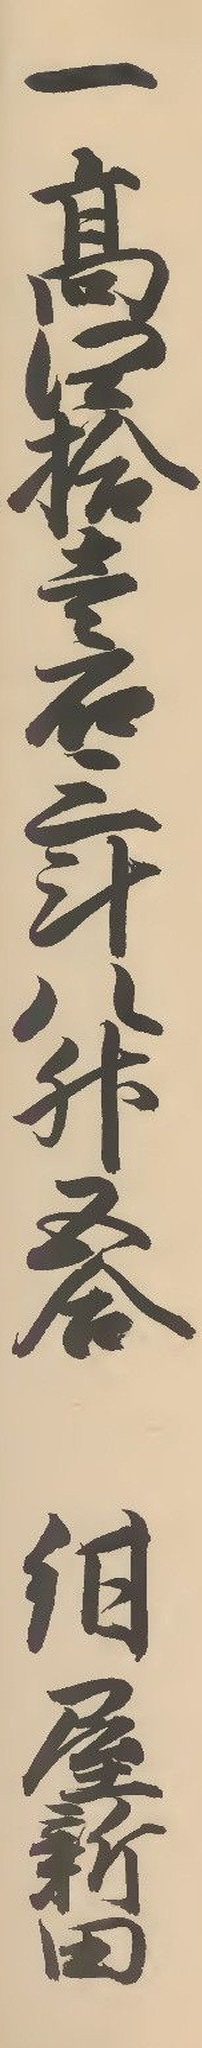一高四拾壱石三斗八升五合紺屋新田
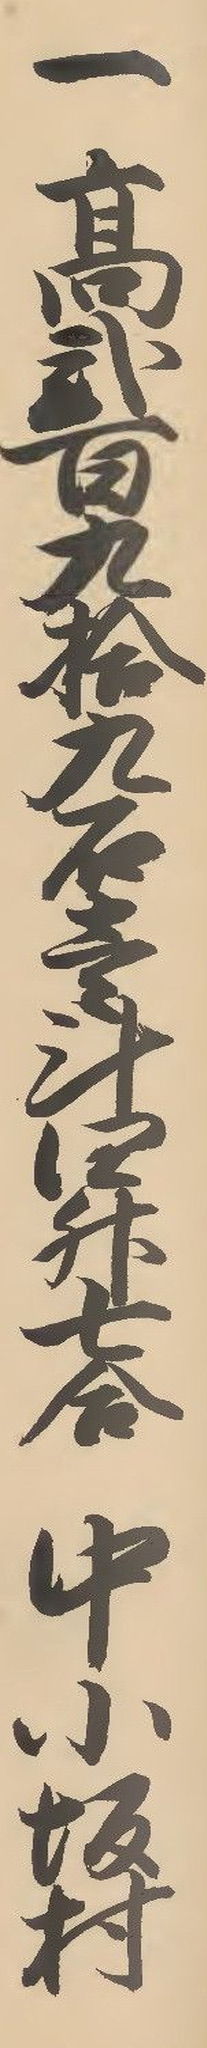一高弐百九拾九石壱斗四升七合中小坂村
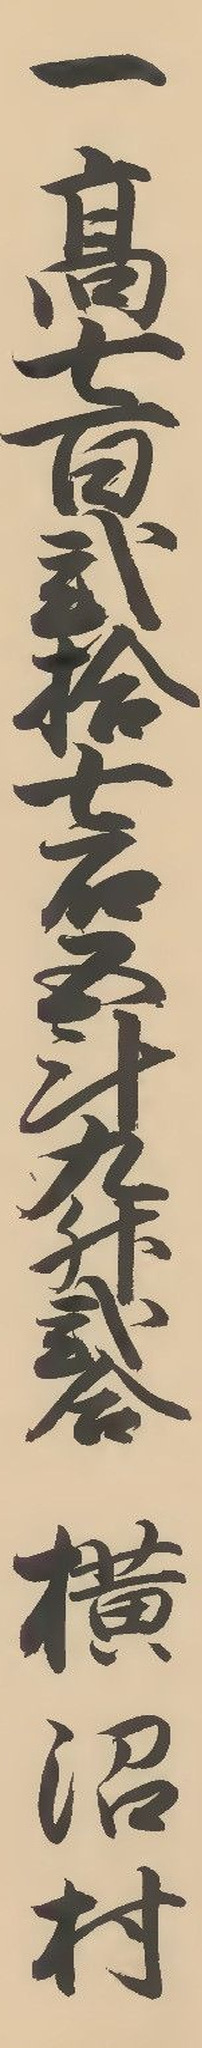一高七百弐拾七石五斗九升弐合横沼村
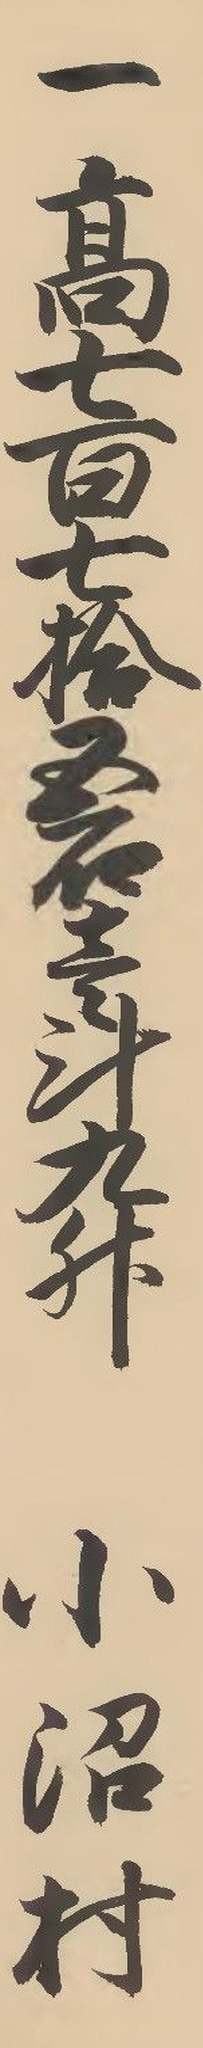一高七百七拾五石壱斗九升小沼村
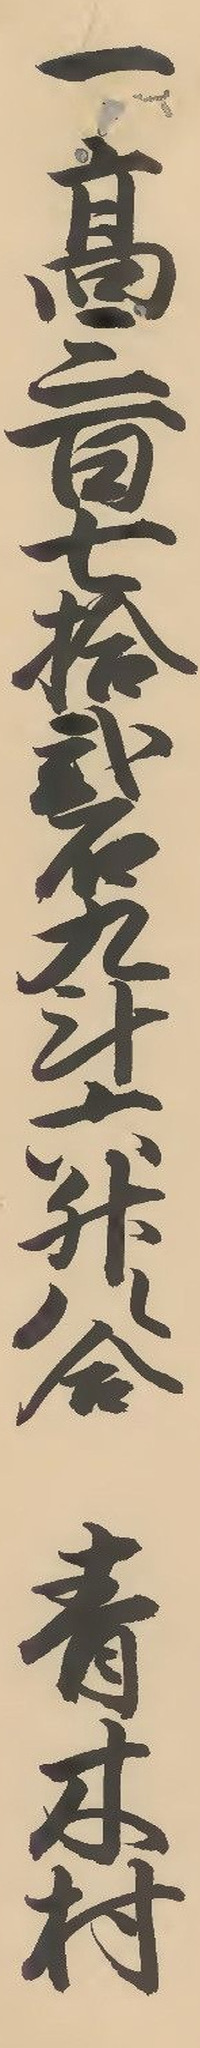一高三百七拾弐石九斗六升八合青木村

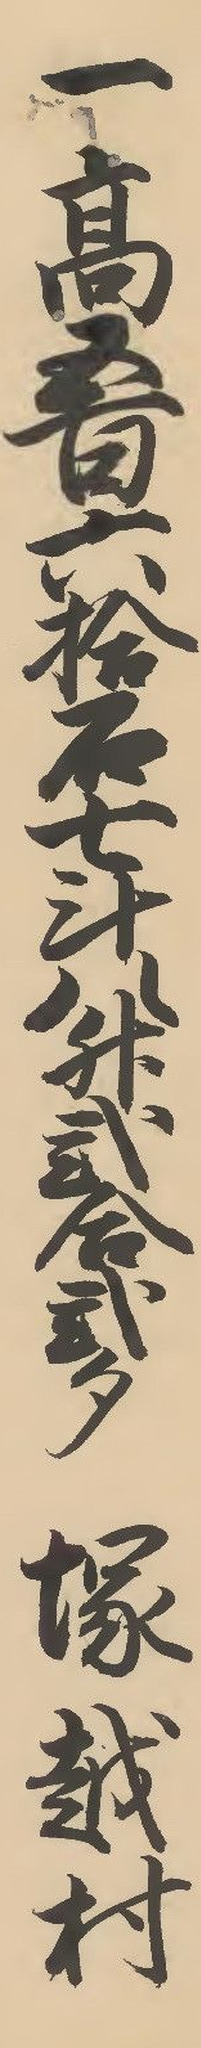一高五百六拾石七斗八升弐合弐勺塚越村
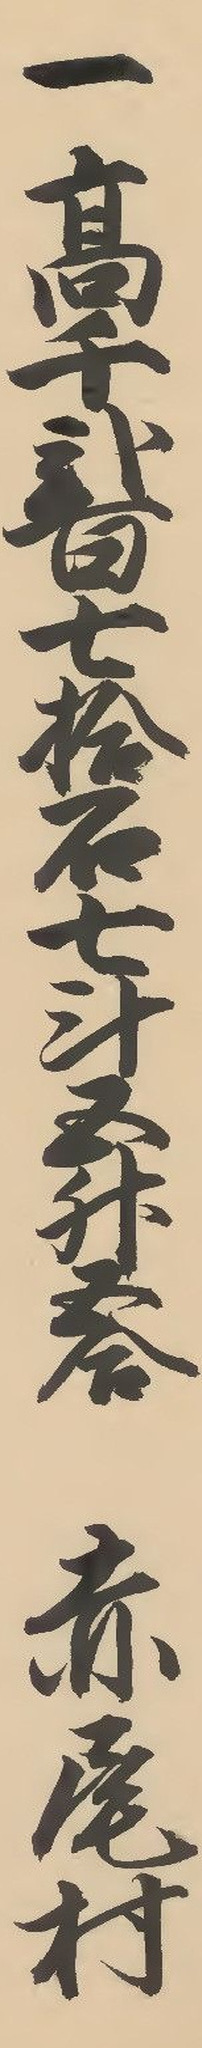一高千弐百七拾石七斗五升五合赤尾村
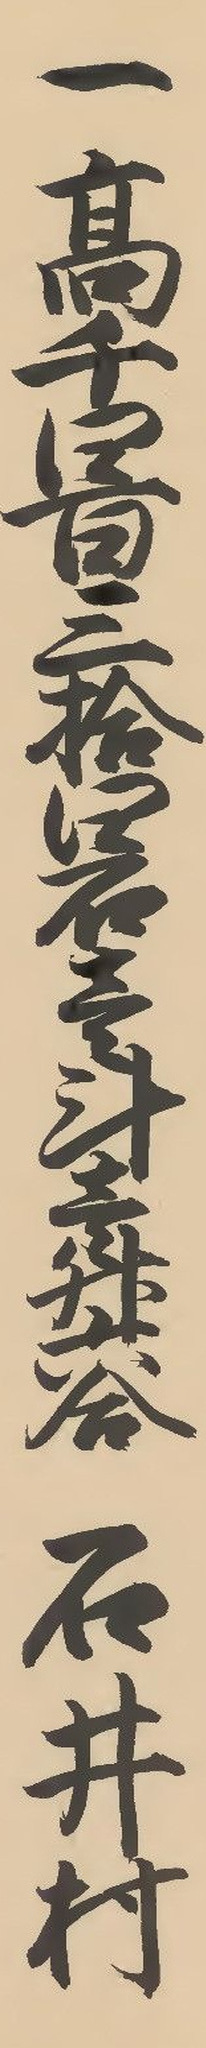一高千四百三拾四石壱斗壱升六合石井村
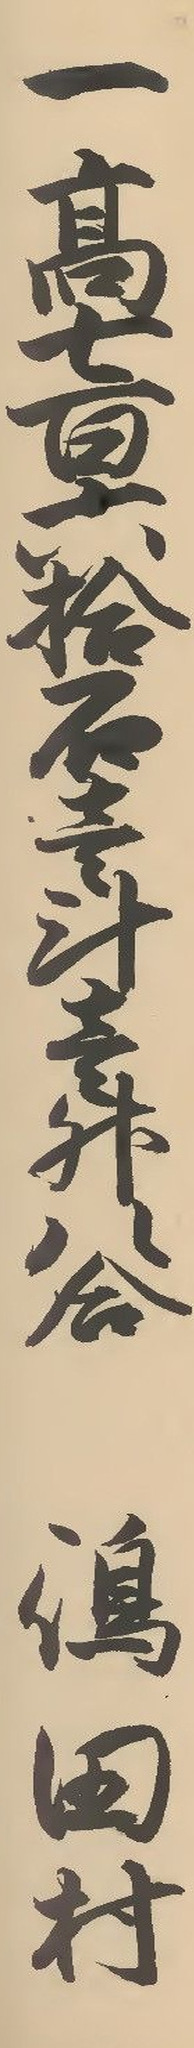一高七百六拾石壱斗壱升八合嶋田村
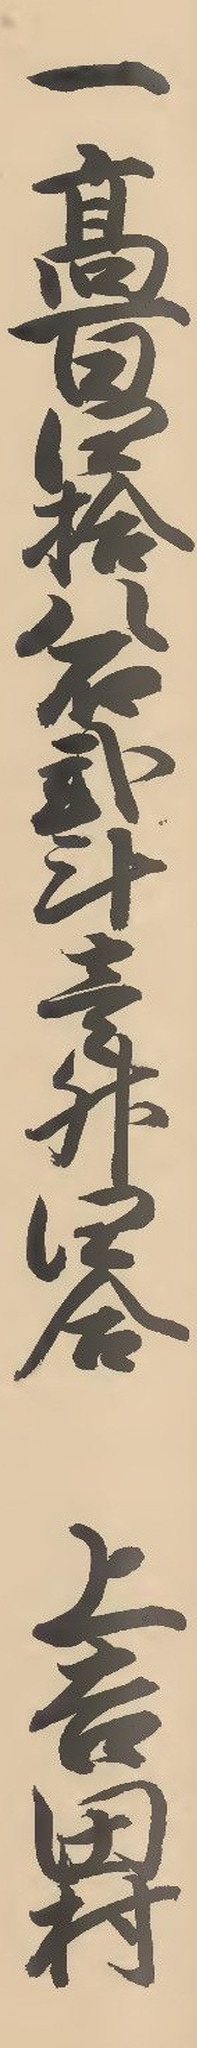一高百四拾八石弐斗壱升四合上吉田村
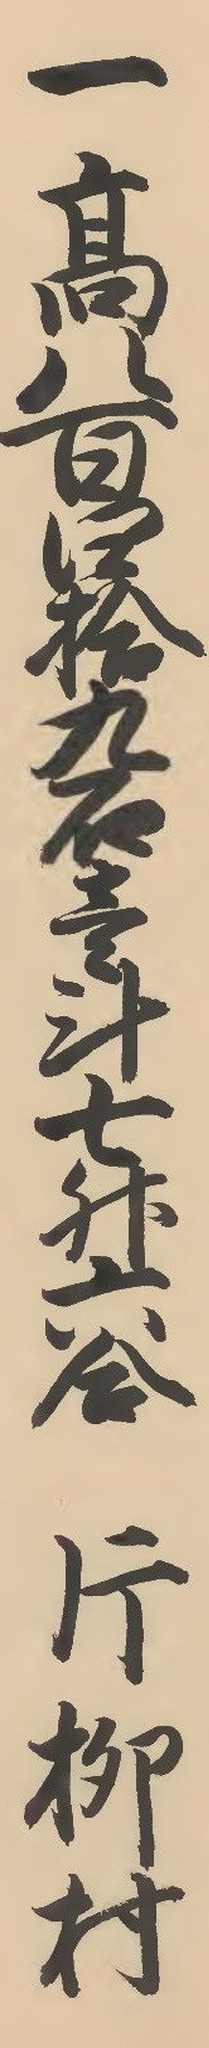一高八百四拾九石壱斗七升六合片柳村
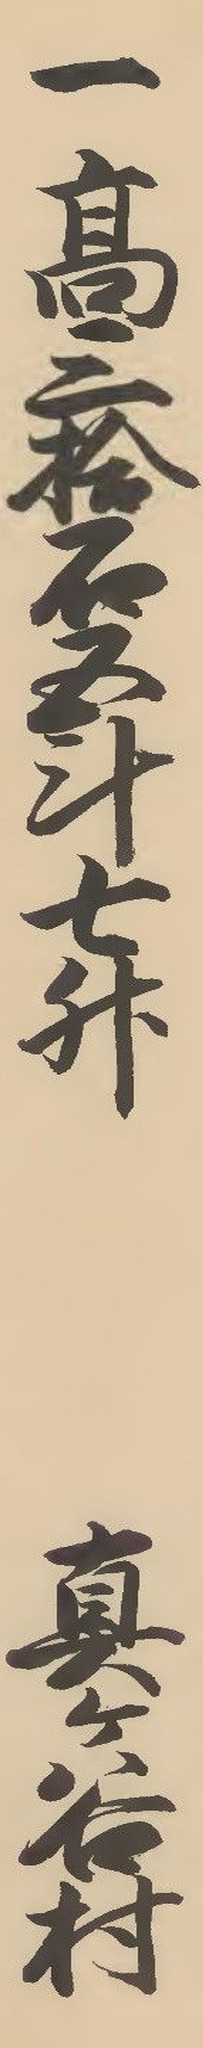一高三拾石五斗七升真ヶ谷村
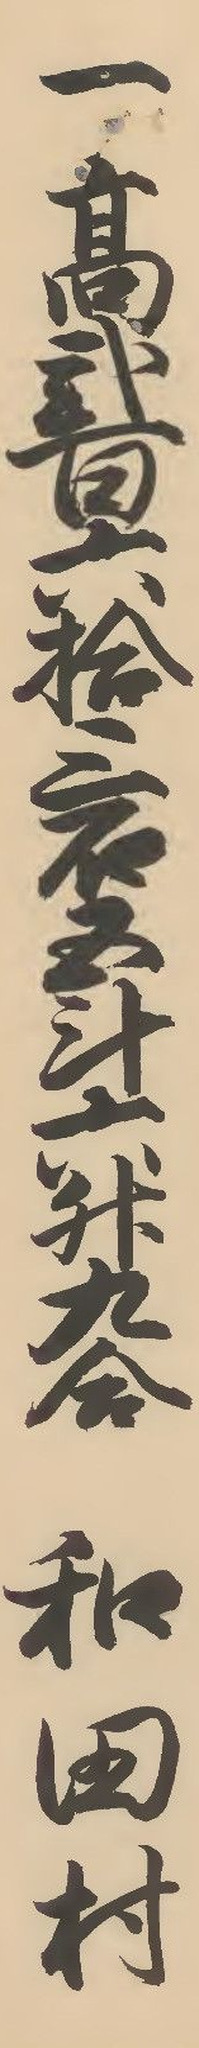一高弐百六拾三石五斗六升九合和田村

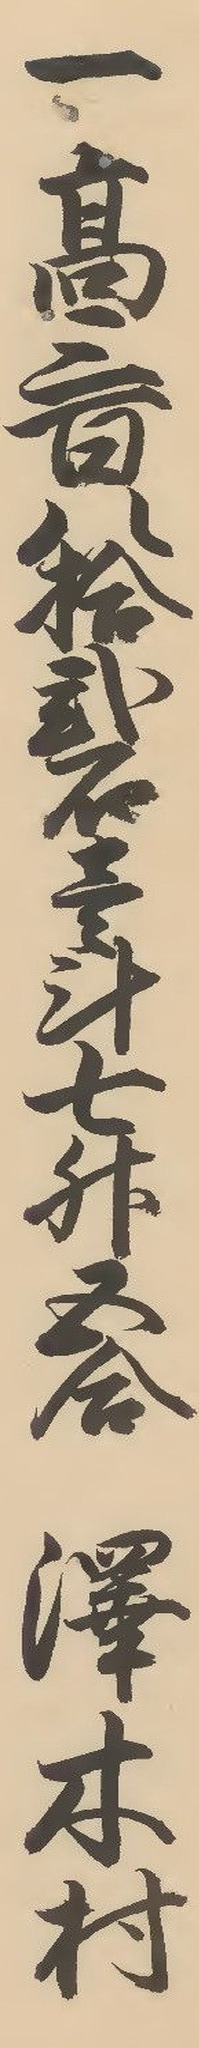一高三百八拾弐石壱斗七升五合澤木村
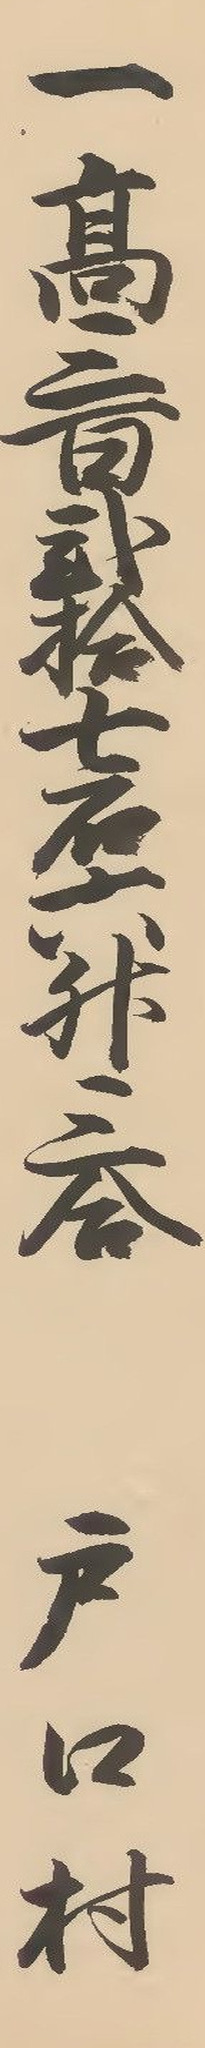一高三百弐拾七石六升三合戸口村
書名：武蔵国郷帳　上
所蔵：国立公文書館 National Archives of Japan
